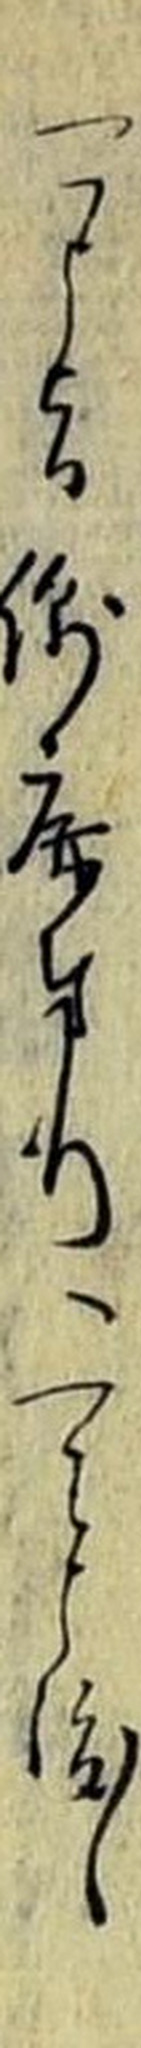可申旨綿麻奉行へ可被申渡候
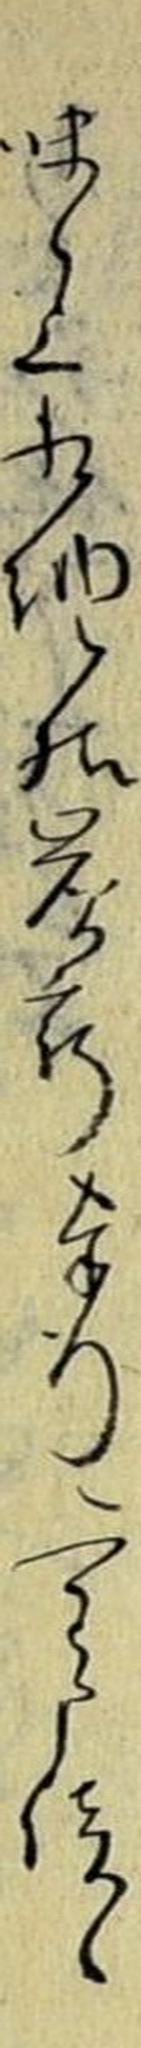味之上相納候様炭薪奉行へ可被申渡候
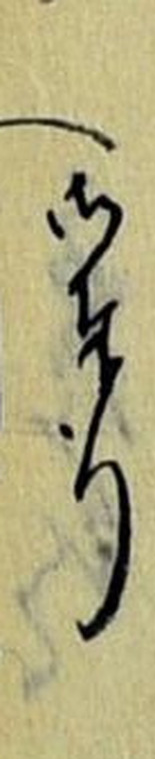御奉行
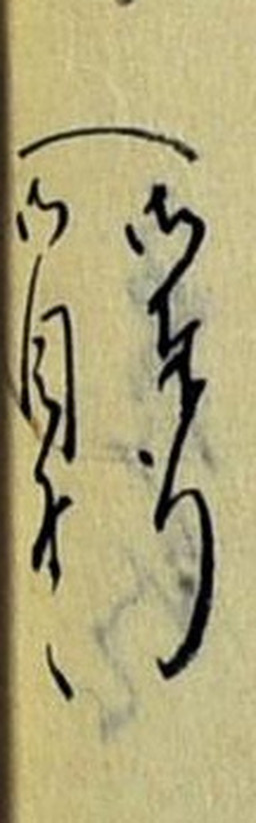御目付へ
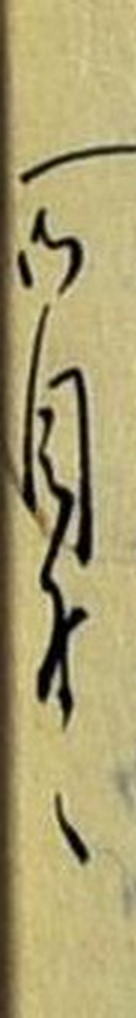御目付へ
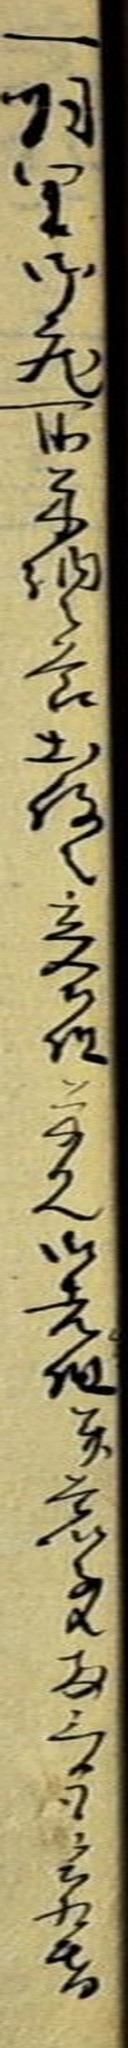一明里御蔵所米納之節出役之立合組御米見御先組并荒子共両三日つヽに而相替
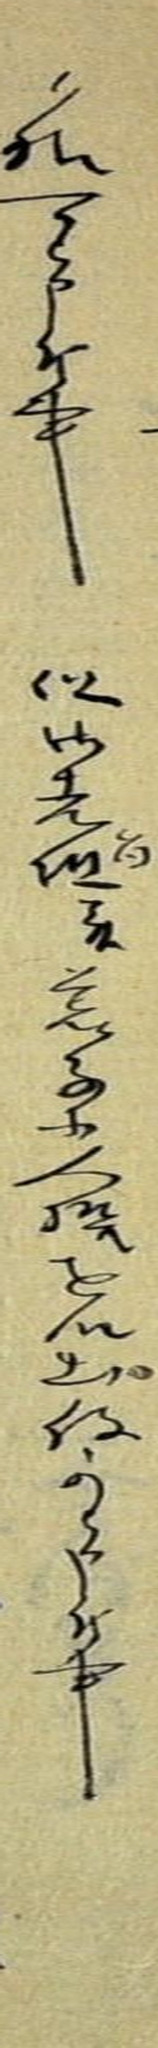候様可被申付事但御先組并荒子等人選を以出役可被申付事
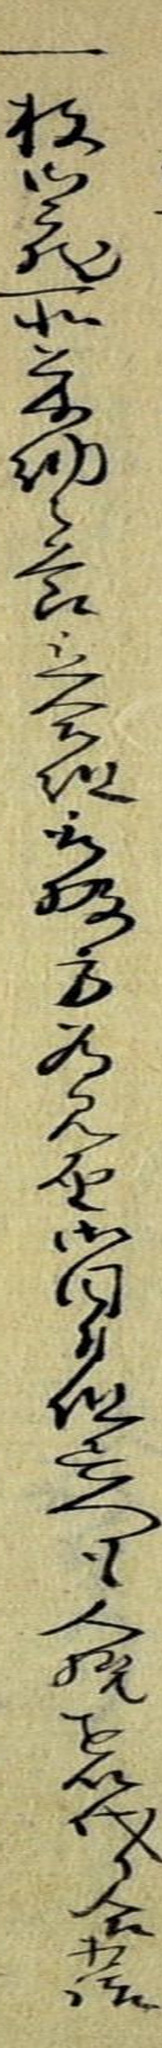一枚御蔵所米納之節立合組取扱方為見届御目付組壱人も人選を以代り合相詰
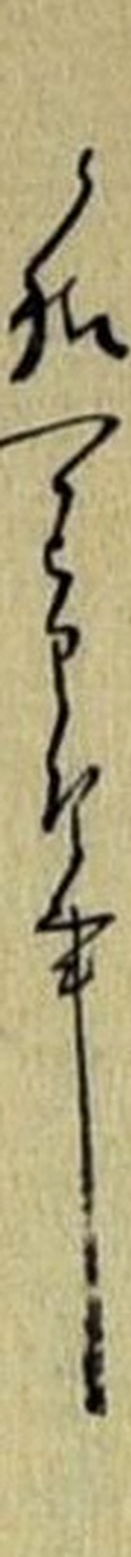候様可被申付事
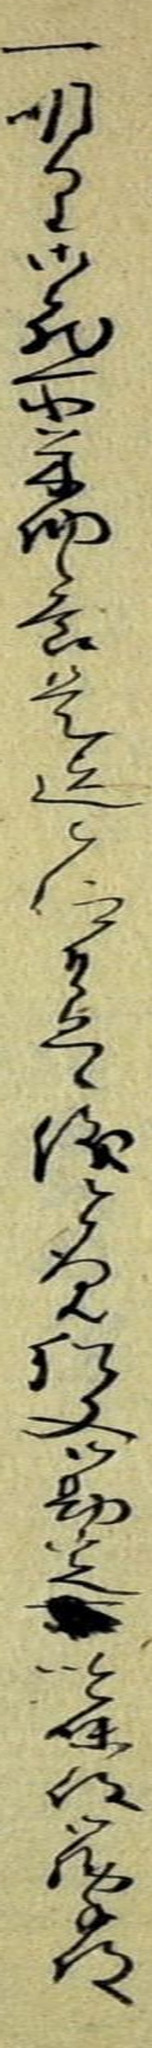一明里御蔵所米納之節是迄被仰付置候儀に候得共猶又御勘定吟味役御勝手役
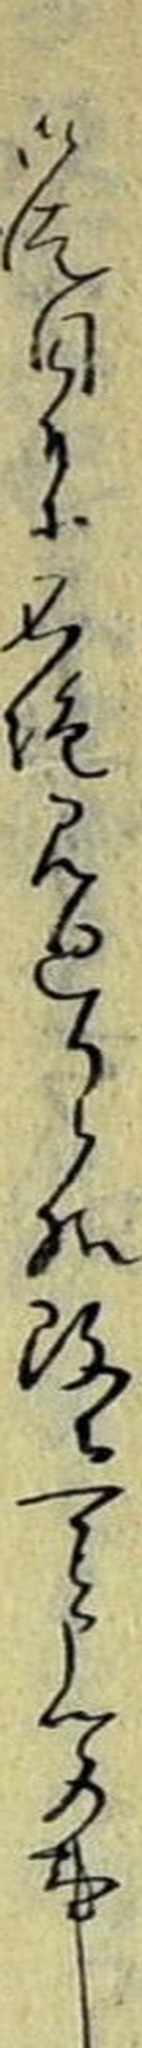御徒目付等不絶見廻り候様改而可被申聞事
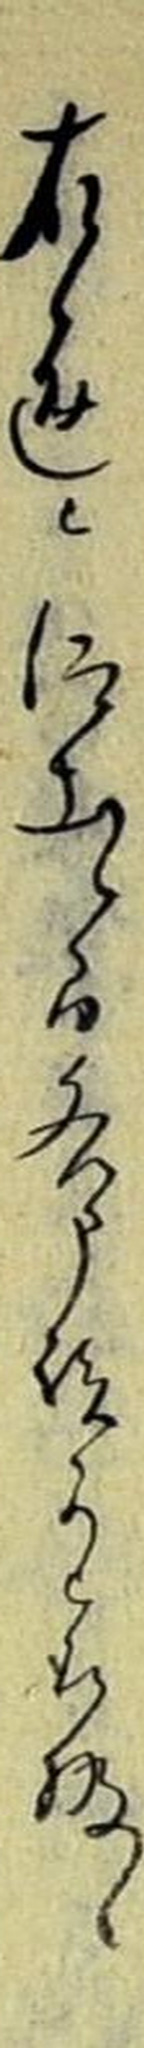右之通被仰出候間各申談可被取扱候
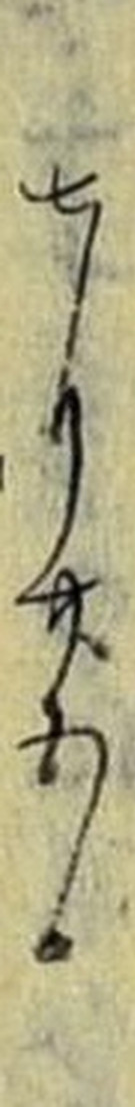七月廿五日
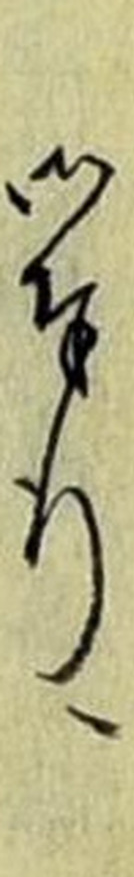御奉行
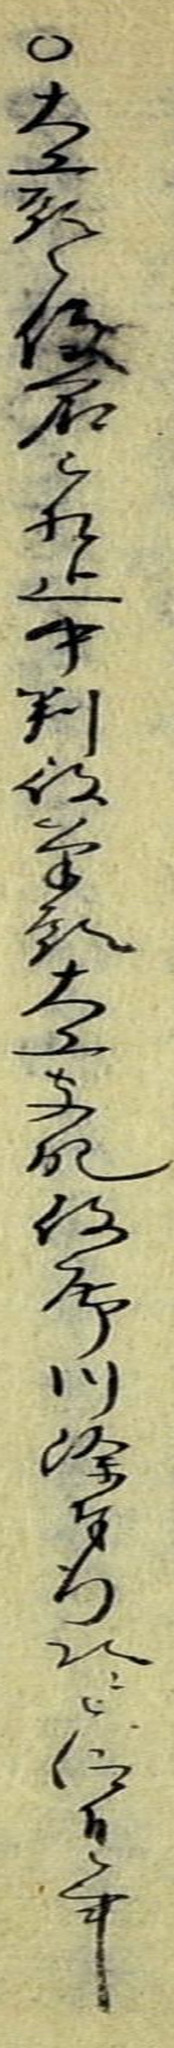○大工頭之儀名被相止中判役筆頭大工支配役席川除奉行次に被仰付候事
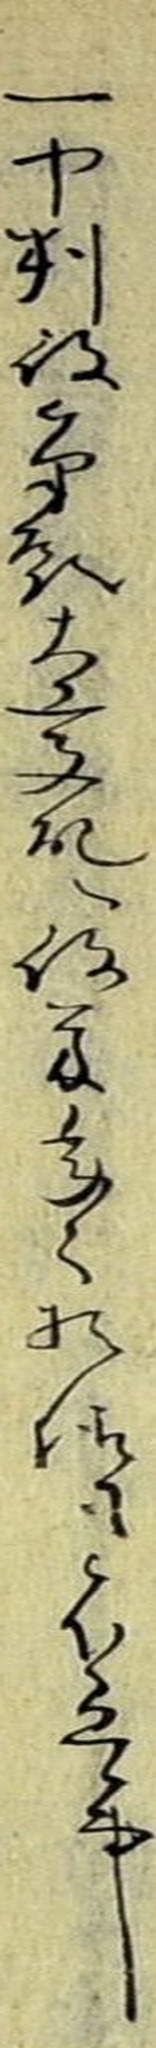一中判役筆頭大工支配へ役米年々拾俵つヽ被下置候事
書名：命令之部 四
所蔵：福井県文書館 Fukui Prefectural Archives
